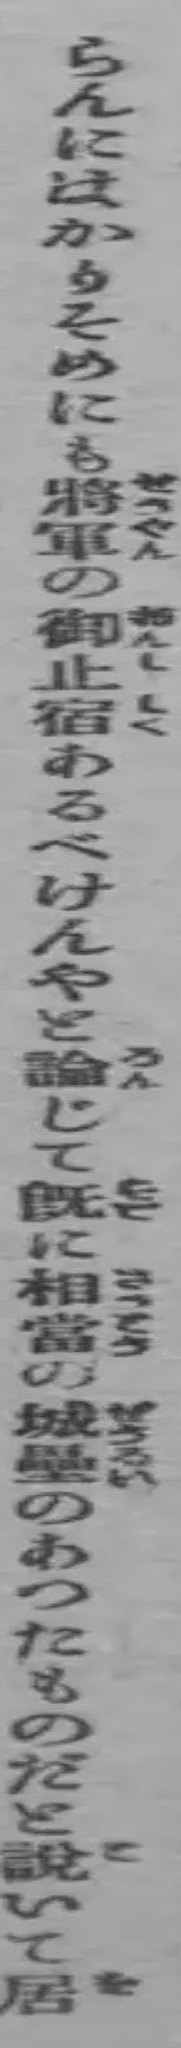らんにはかりそめにも将軍の御止宿あるべけんやと論じて既に相当の城塁のあつたものだと説いて居
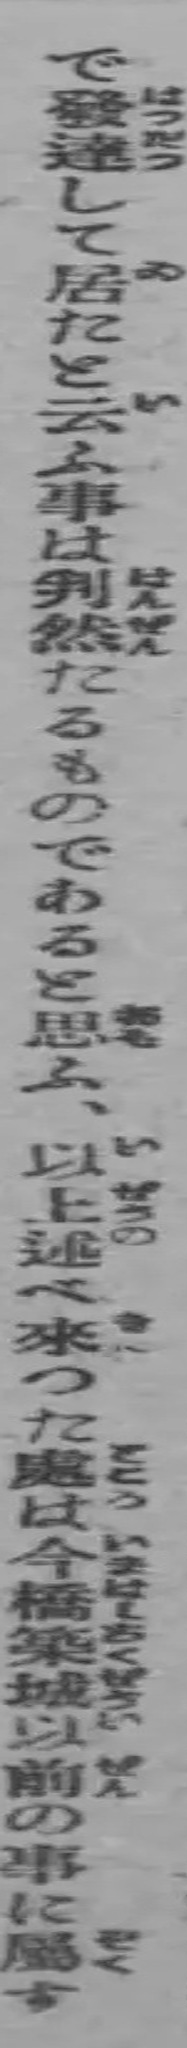で発達して居たと云ふ事は判然たるものであると思ふ、以上述べ来つた処は今橋築城以前の事に属す
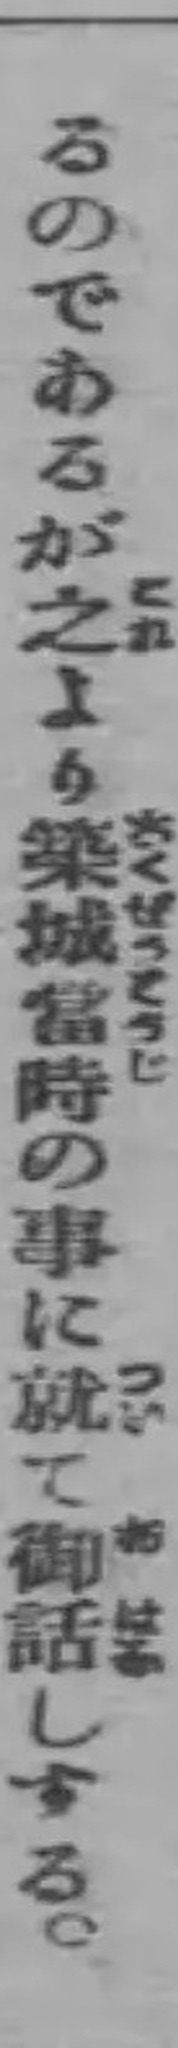るのであるが之より築城当時の事に就て御話しする。
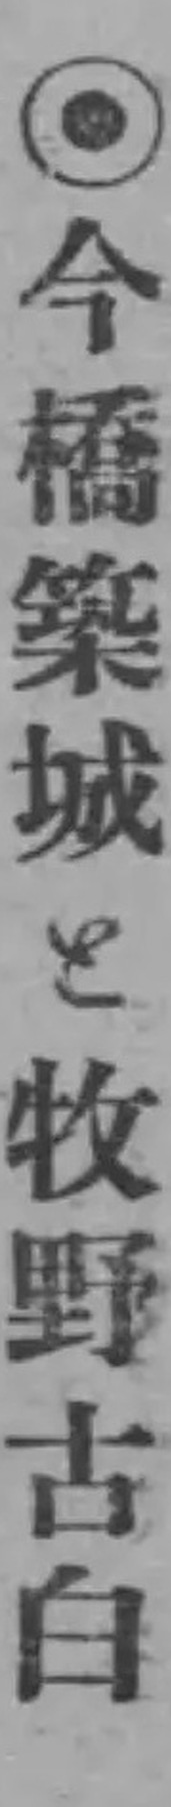⦿今橋築城と牧野古白
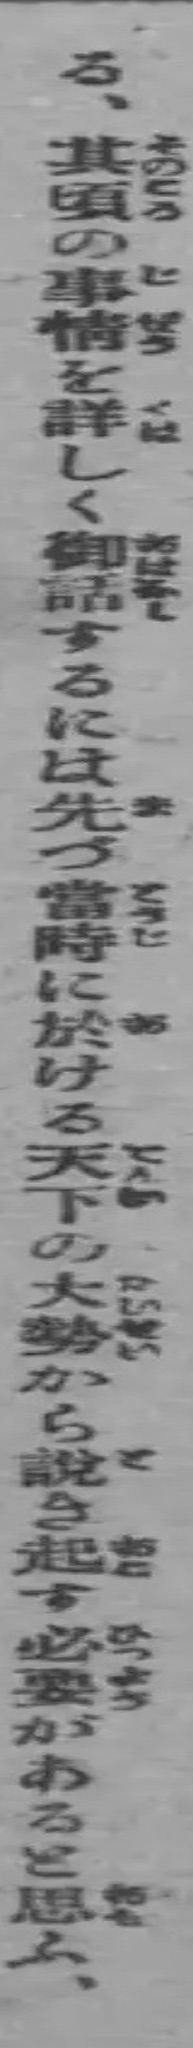る、其頃の事情を詳しく御話するには先づ当時に於ける天下の大勢から説き起す必要があると思ふ、
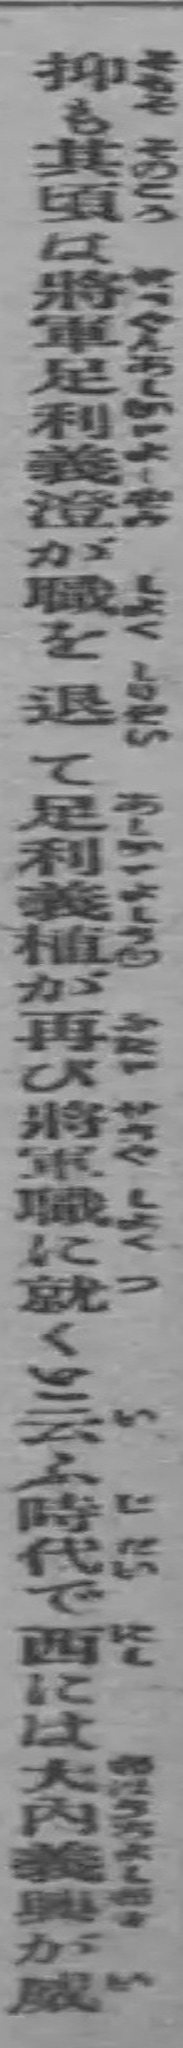抑も其頃は将軍足利義澄が職を退て足利義稙が再び将軍職に就くと云ふ時代で西には大内義興が威
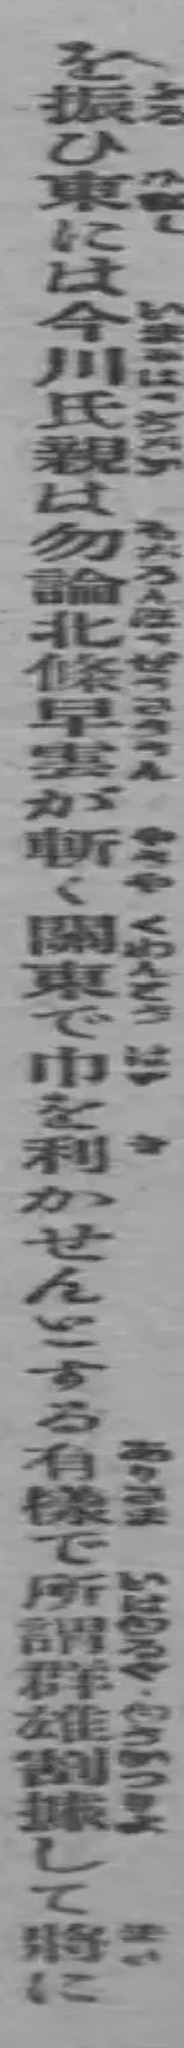群雄割拠を振ひ東には今川氏親は勿論北条早雲が斬く関東で巾を利かせんとする有様で所謂群雄割拠して将に
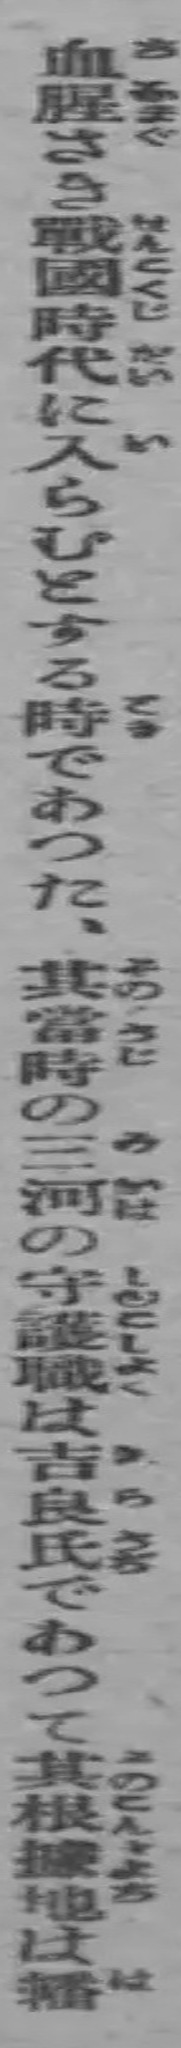血腥さき戦国時代に入らむとする時であつた、其当時の三河の守護職は吉良氏であつて其根拠地は幡
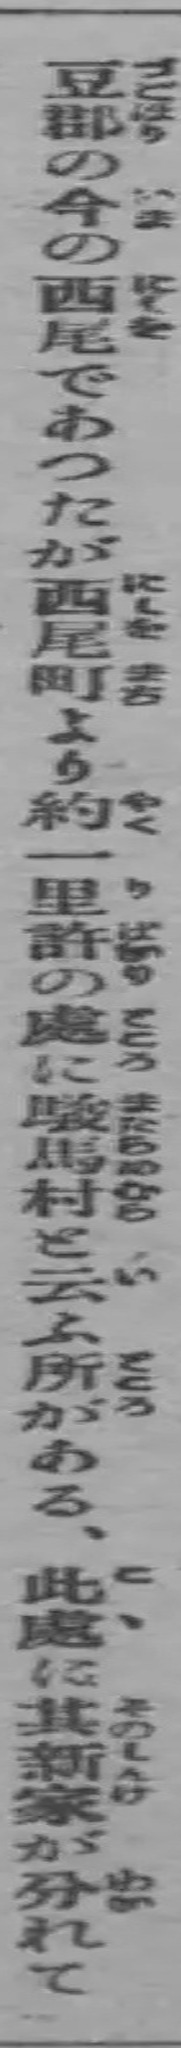豆郡の今の西尾であつたが西尾町より約一里許の処に駮馬村と云ふ所がある、此処に其新家が分れて
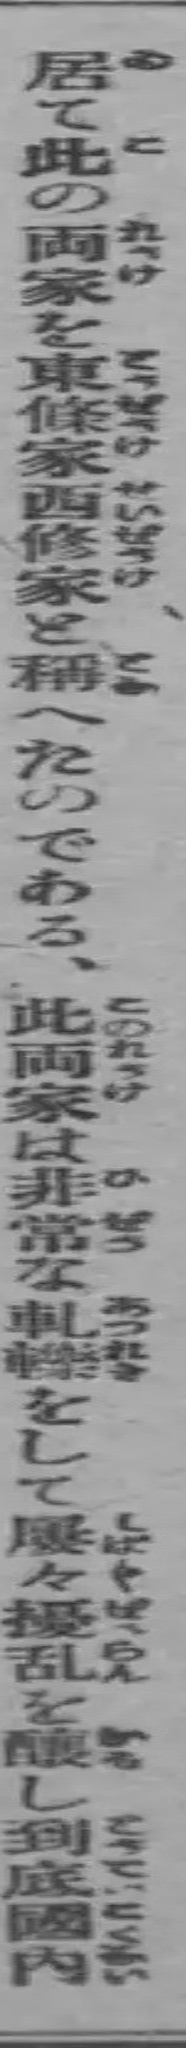居て此の両家を東条家西条家と称へたのである、此両家は非常な軋轢をして屡々擾乱を醸し到底国内
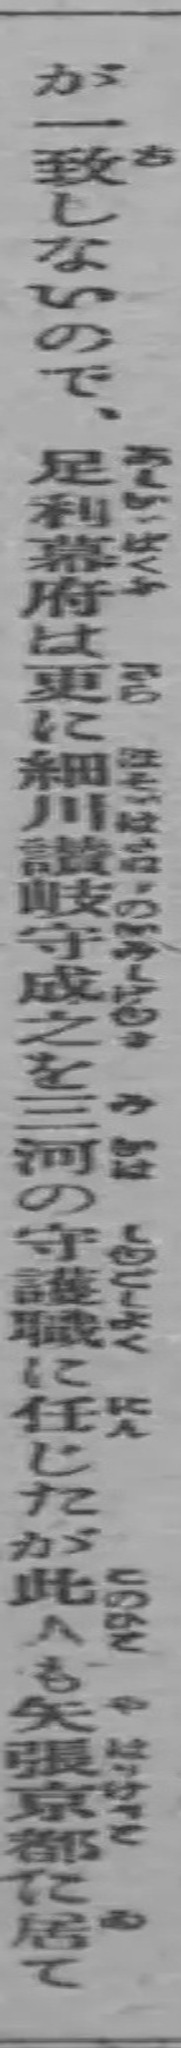が一致しないので、足利幕府は更に細川讃岐守成之を三河の守護職に任じたが此人も矢張京都に居て
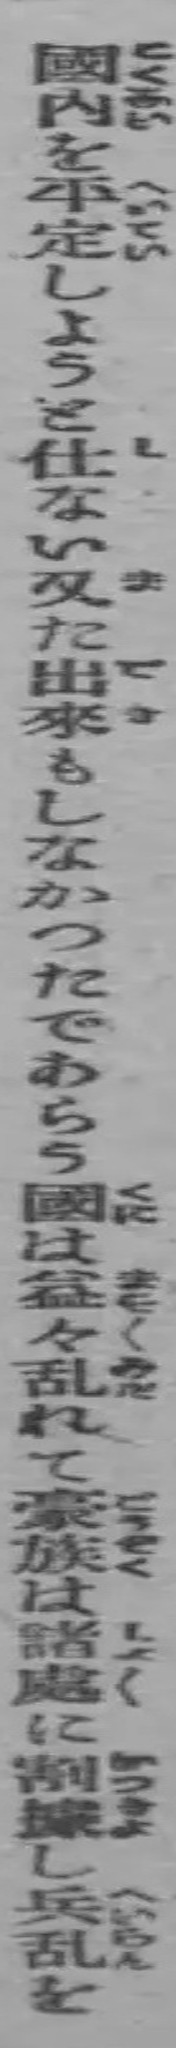国内を平定しようと仕ない又た出来もしなかつたであらう国は益々乱れて豪族は諸処に割拠し兵乱を
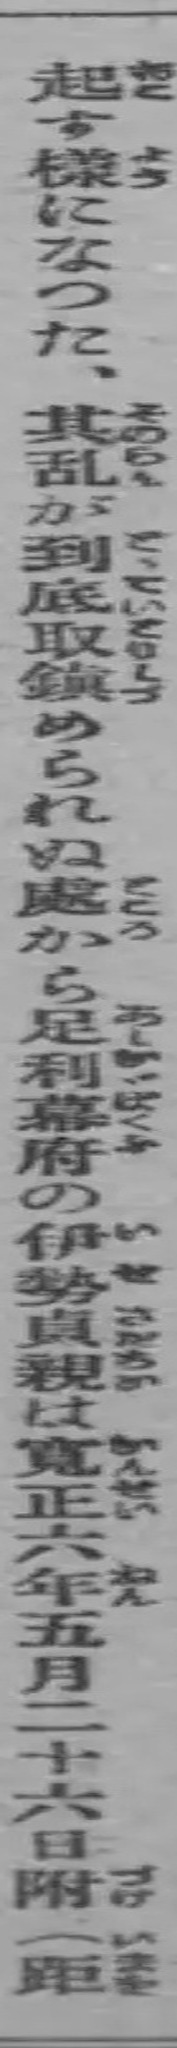起す様になつた、其乱が到底取鎮められぬ処から足利幕府の伊勢貞親は寛正六年五月二十六日附(距
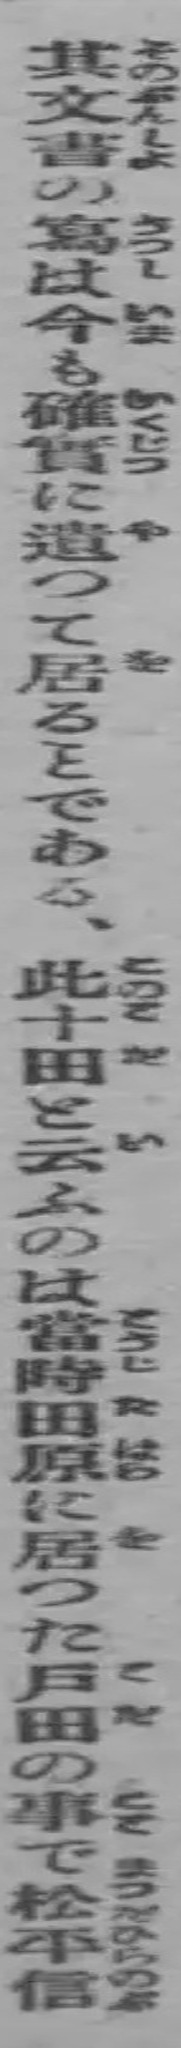其文書の写は今も確実に遺つて居ることである、此十田と云ふのは当時田原に居つた戸田の事で松平信
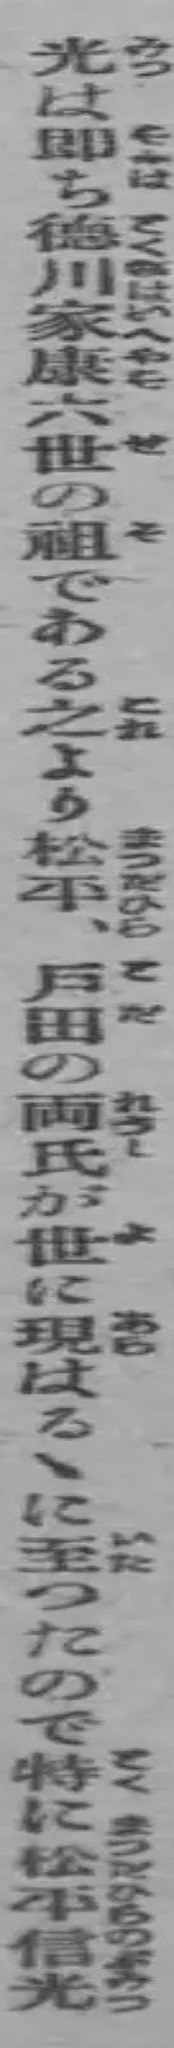光は即ち徳川家康六世の祖である之より松平、戸田の両氏が世に現はるゝに至つたので特に松平信光
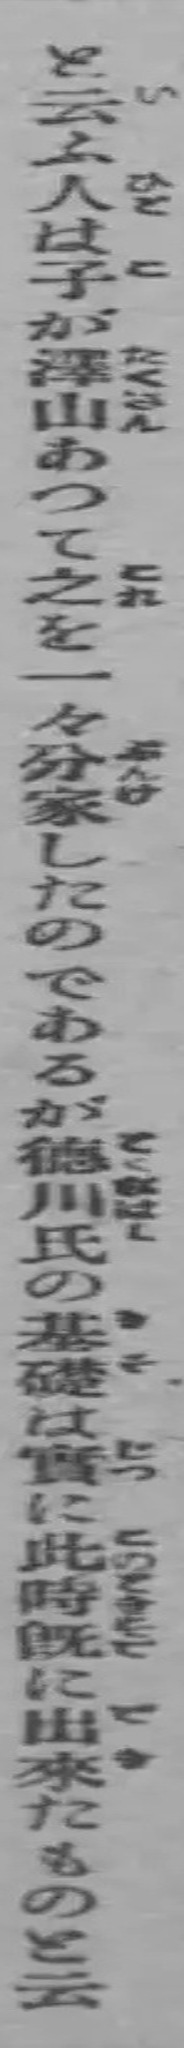と云ふ人は子が沢山あつて之を一々分家したのであるが徳川氏の基礎は実に此時既に出来たものと云
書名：豊橋市史談
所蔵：国立国会図書館 National Diet Library, JAPAN
